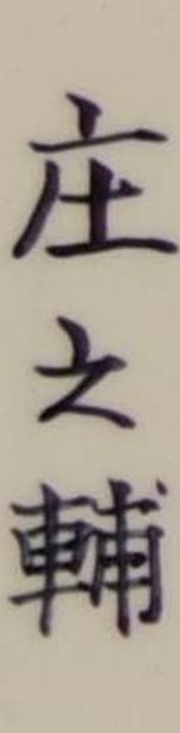庄之輔
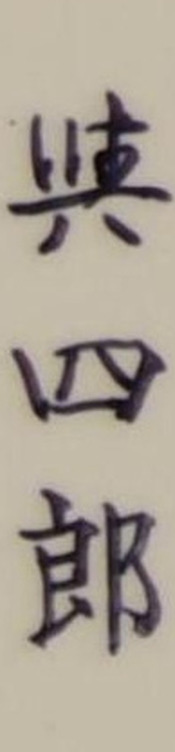与四郎

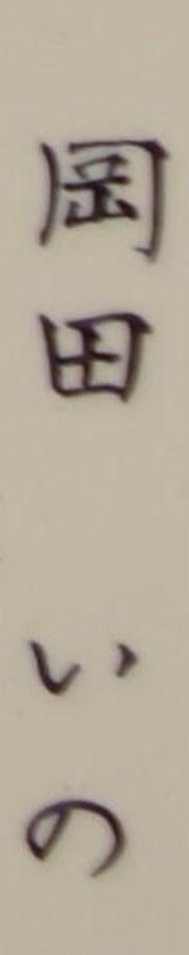岡田いの
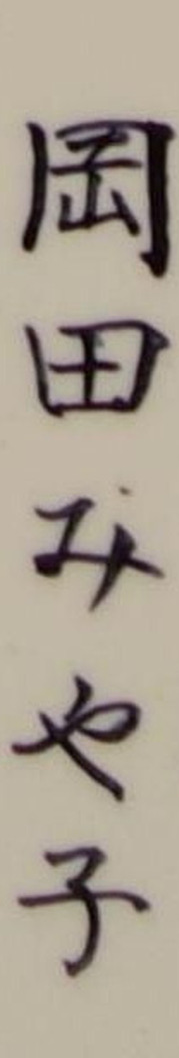岡田みや子
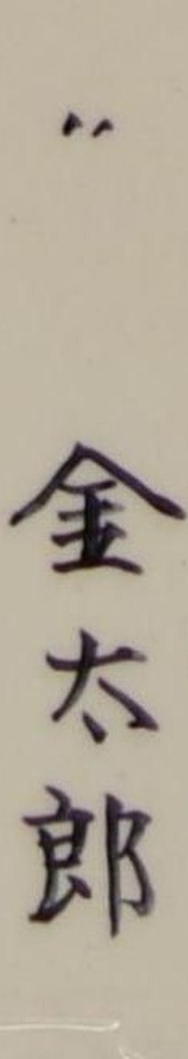金太郎
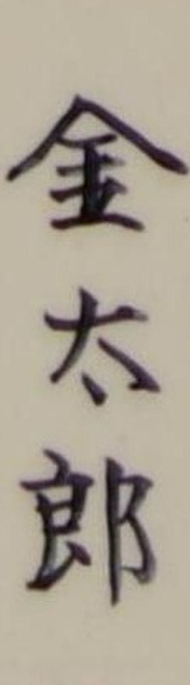金太郎
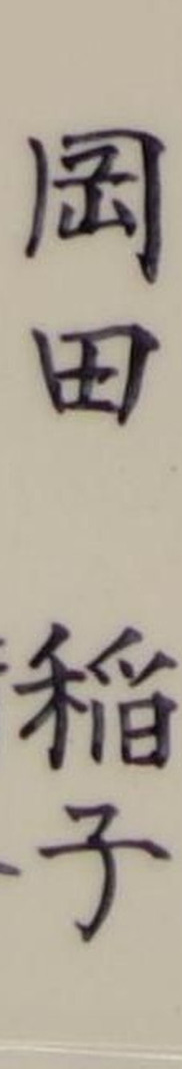岡田稲子
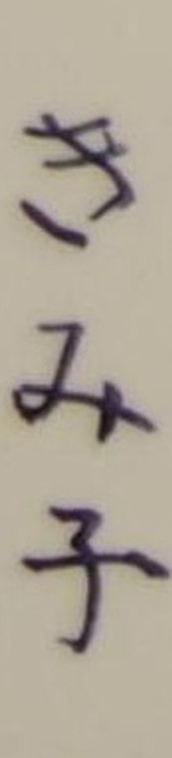きみ子
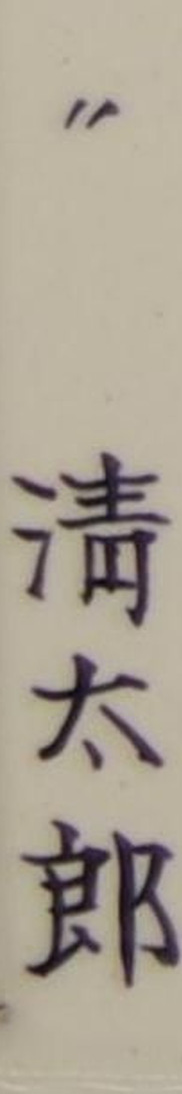清太郎
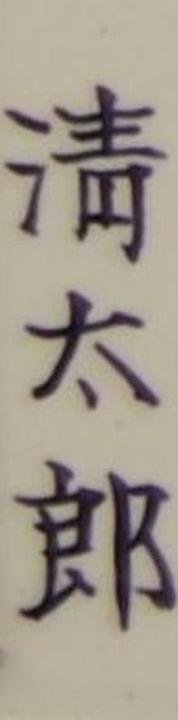清太郎

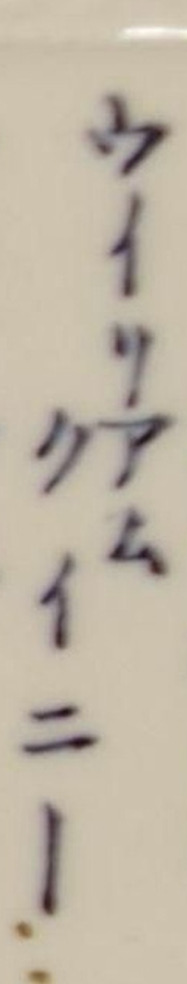ウィリアムクイニー
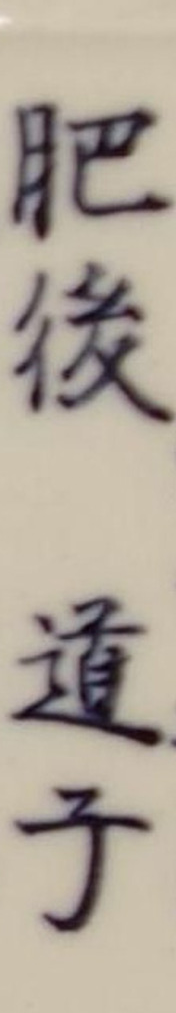肥後道子
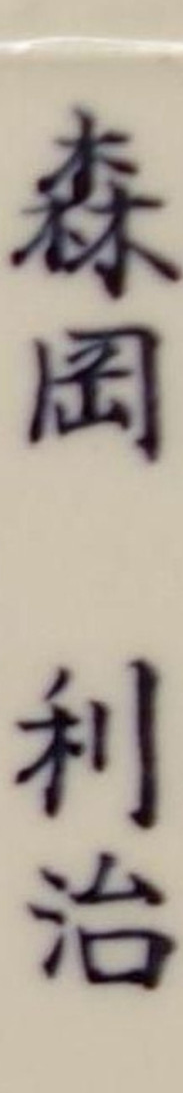森岡利治
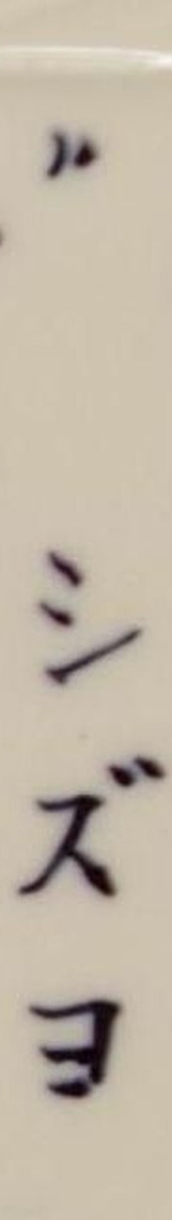シズヨ
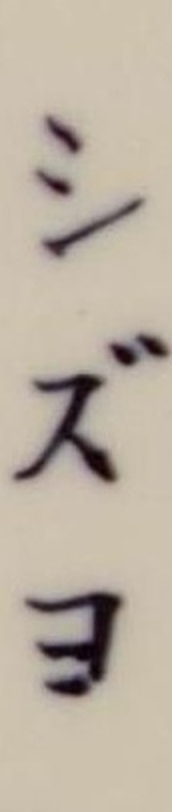シズヨ
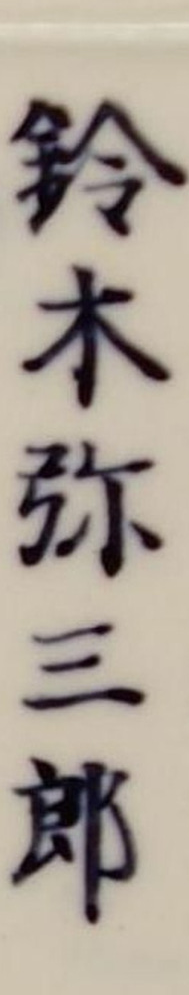鈴木弥三郎
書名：M~S
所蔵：高野山金剛峯寺
